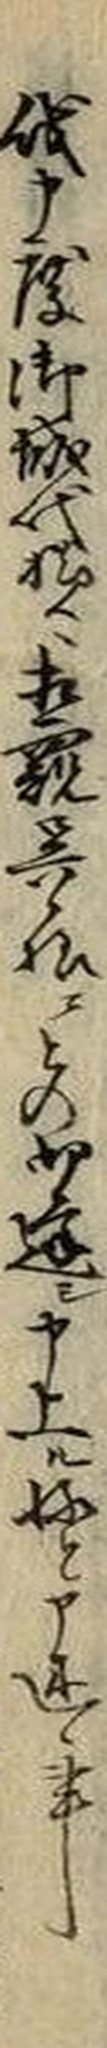伐申度御城代様へ相窺呉候様にとの御達シ申上ル抔と申述候事
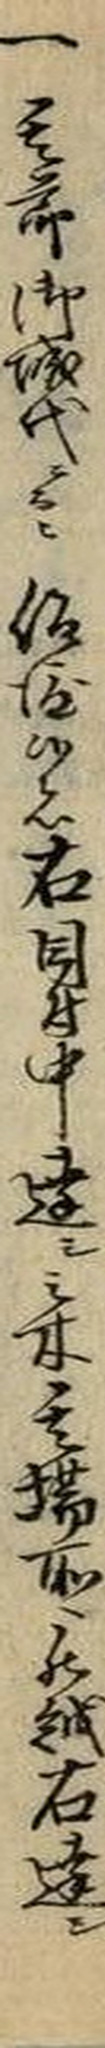一其節御城代にて被仰渡候は右目付中達シ之木其場所へ罷越右達シ
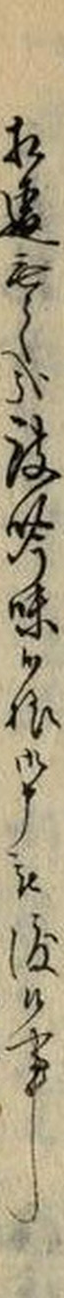相違無之哉致吟味候様御申被渡候事
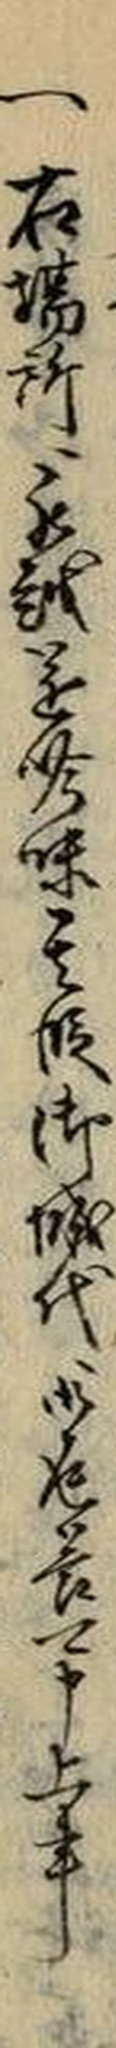一右場所へ罷越遂吟味其段御城代へ御返答可申上事
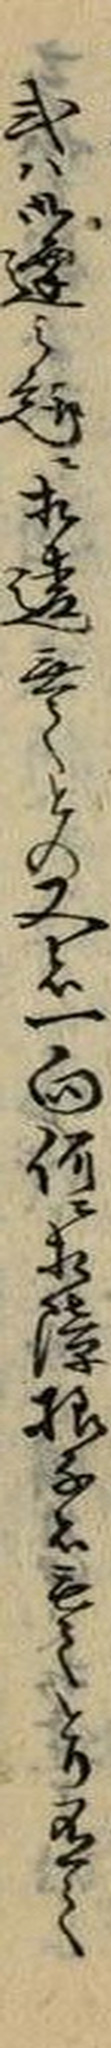或は御達之趣に相違無之との又は一向何に相障様子は無之とか有之
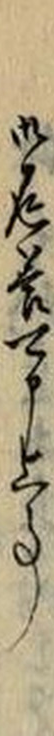御返答可申上事
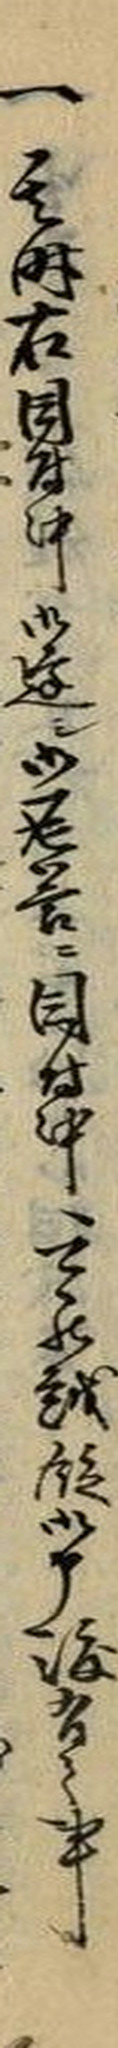一其時右目付中御達シ御返答に目付中へ可罷越段御申渡有之事
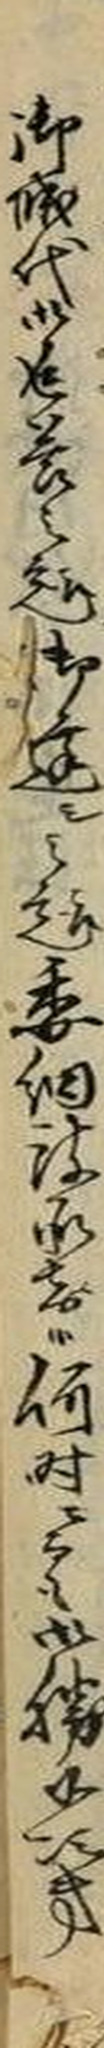御城代御返答之趣御達シ之趣委細致承知候何時にても御勝手次第
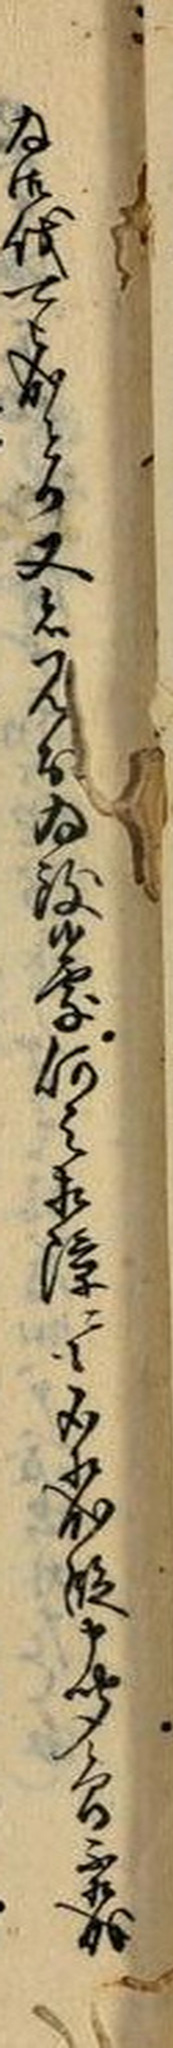為御伐可被成とか又は見分為致候処何之御障にも不相成段申聞候間不相成
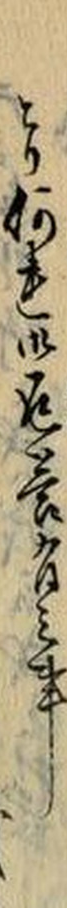とか何れ御返答有之事
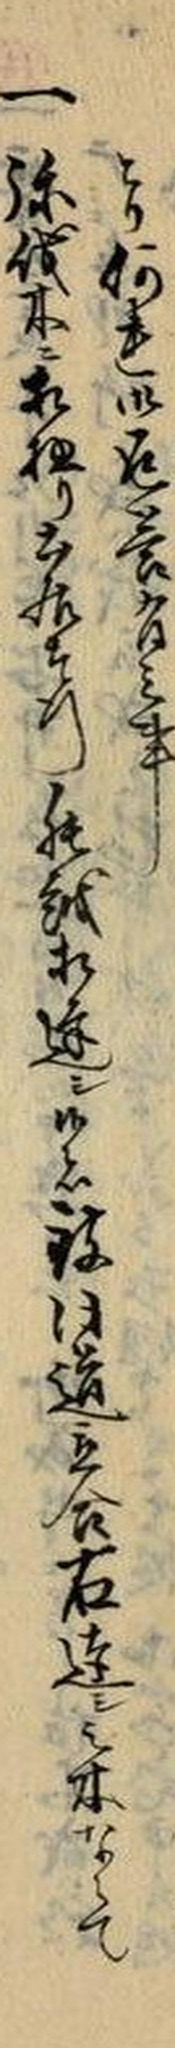一弥伐木に相極り土居奉行罷越相達シ候は致同道立合右達シ之木ならて
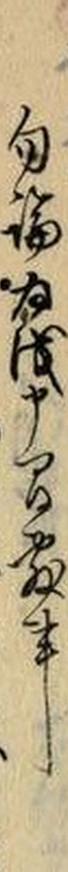勿論為伐申間敷事
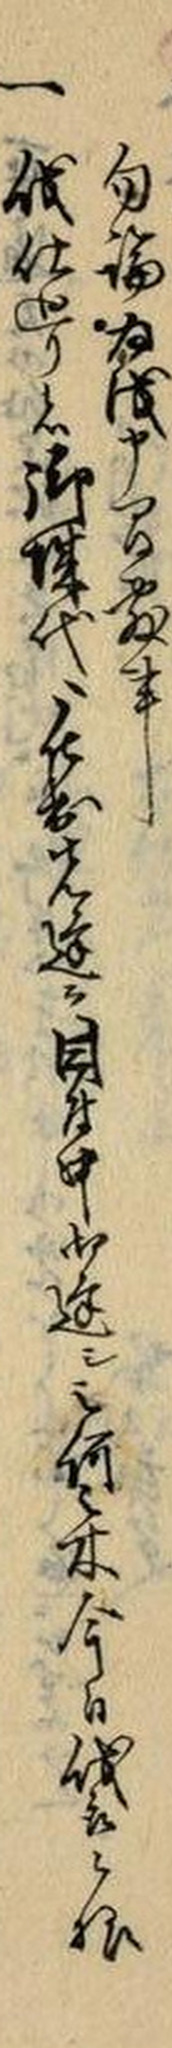一伐仕廻りは御城代へ罷出先達て目付中御達シ之何之木今日伐取候様
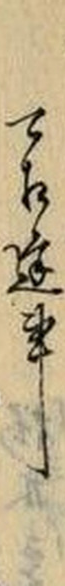可相達事
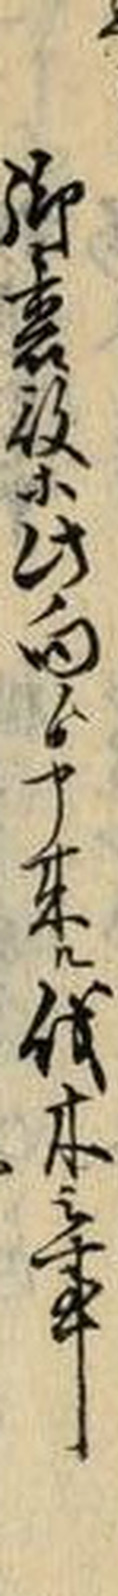御裏役等此向ゟ申来ル伐木之事
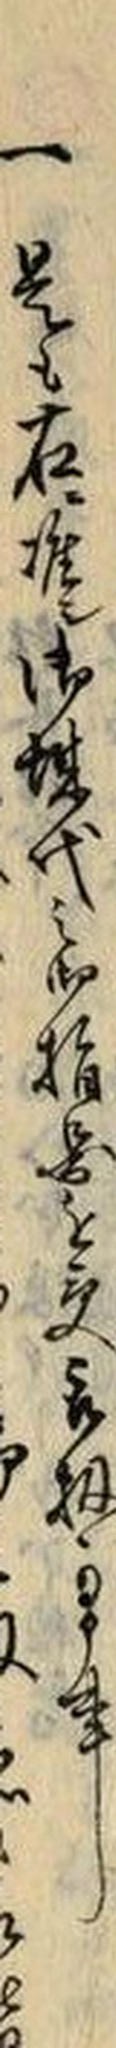一是も右に准シ御城代之御指図を受被取扱可申事
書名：御城下諸事之部
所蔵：福井県文書館 Fukui Prefectural Archives
